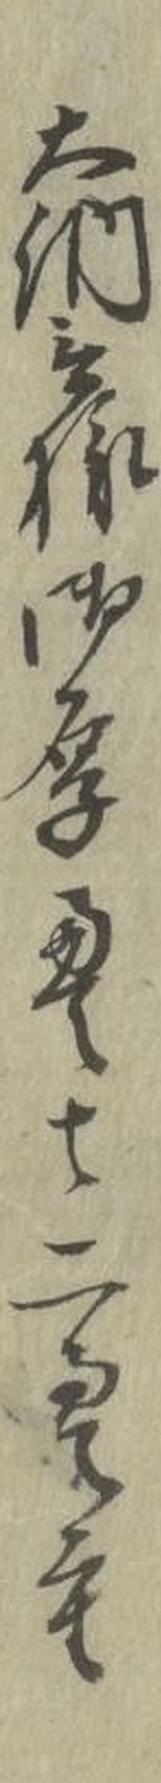大納言様厚畳は二畳重
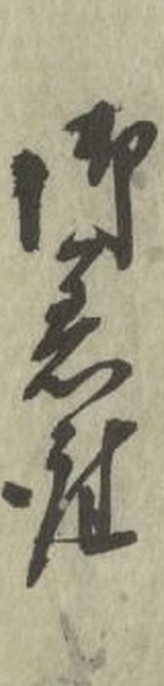御着座
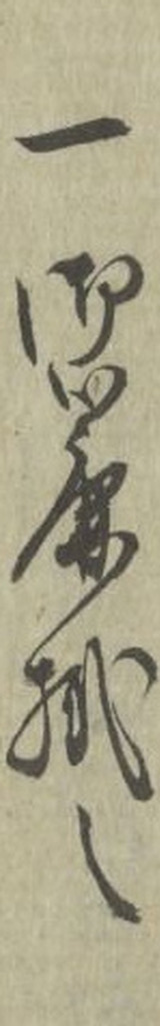一御簾掛之
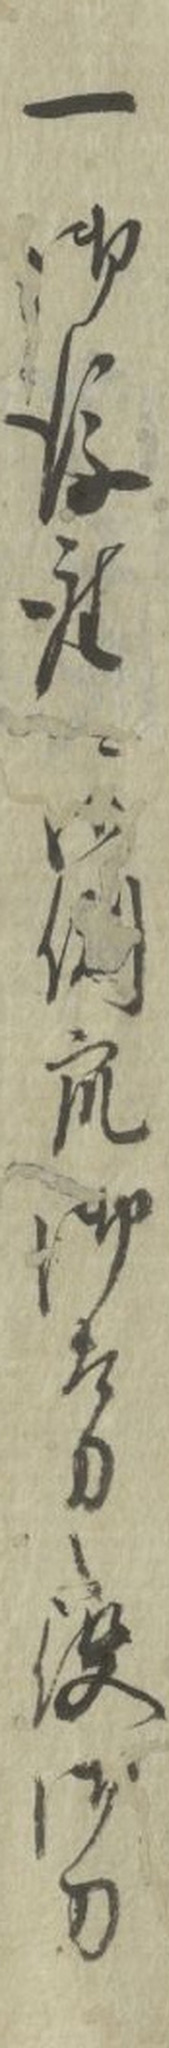一御後座に御側衆御太刀之役御刀
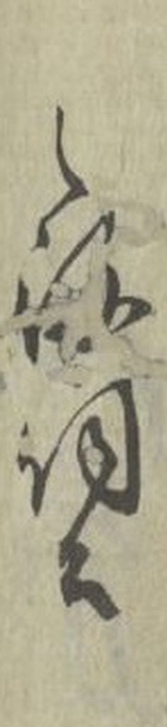之役伺公
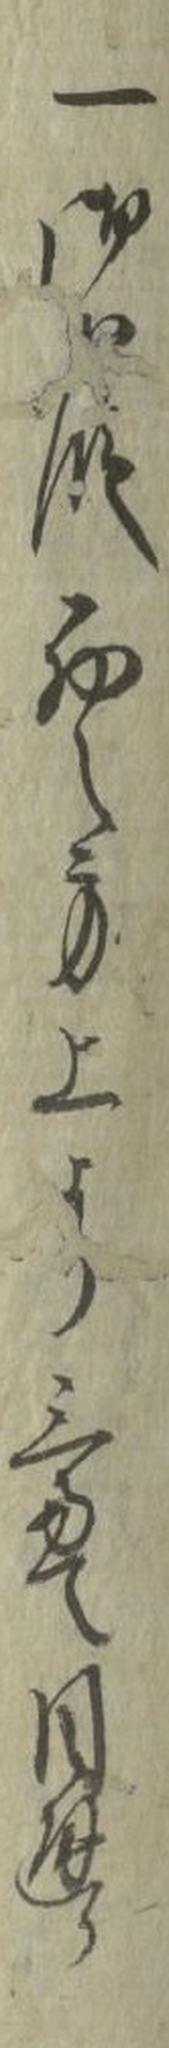一御下段西之方上より三畳目通り
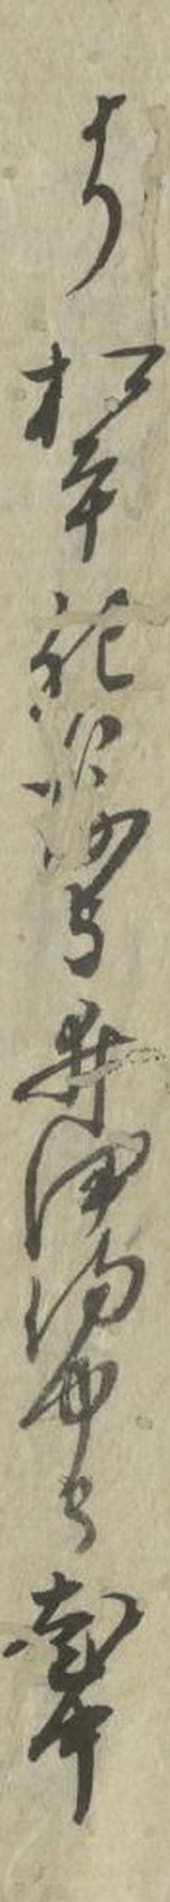より松平肥後守井伊備中守老中
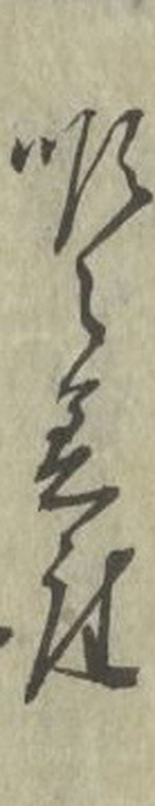順々着座
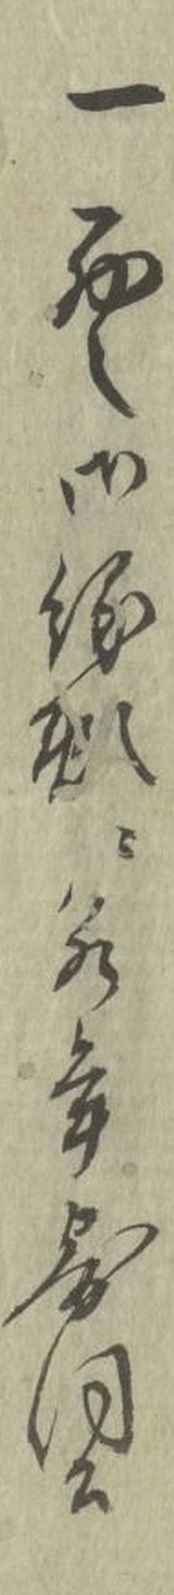一西之御縁頬に若年寄伺公
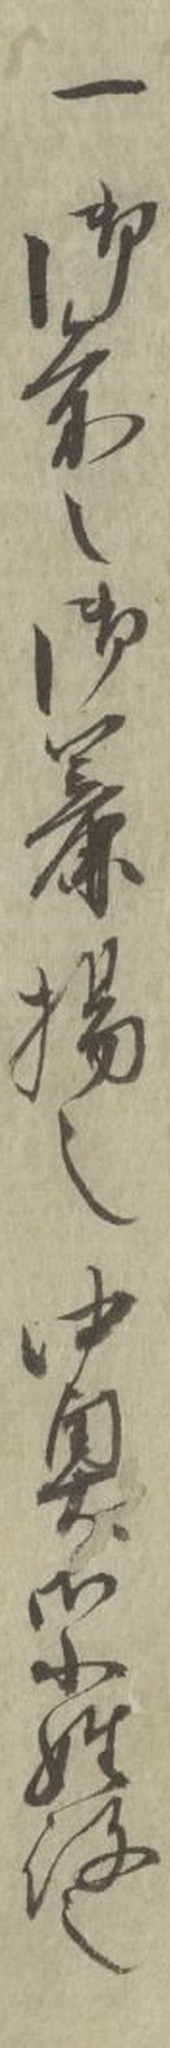一御前之御簾揚之中奥御小姓役之

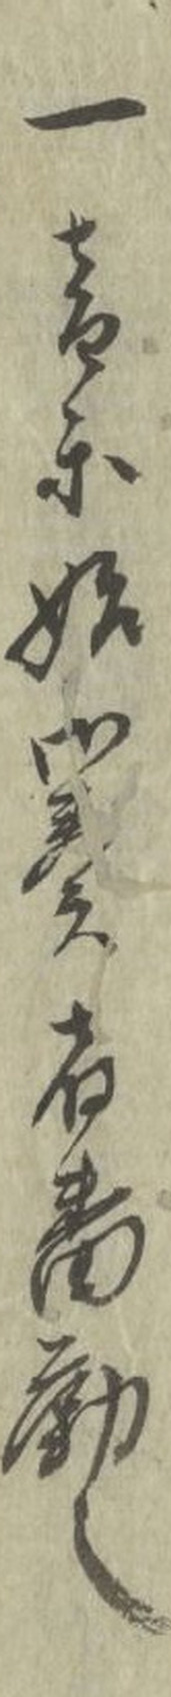一音楽始御奏者番勤之
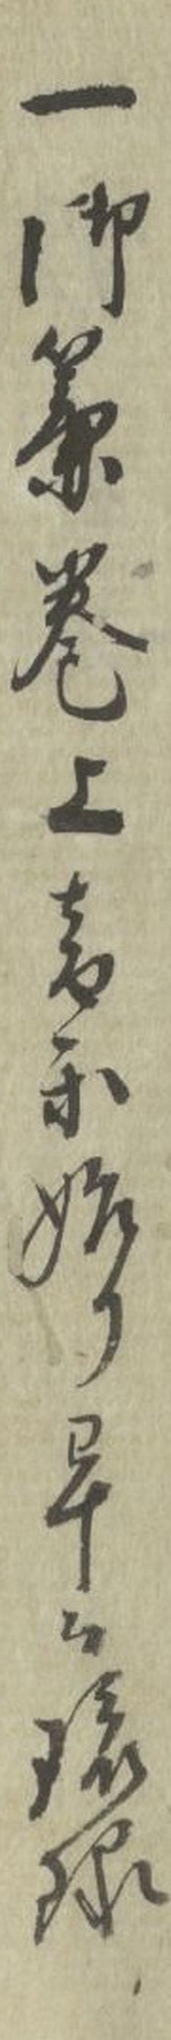一御簾巻上音楽始り畢而琉球
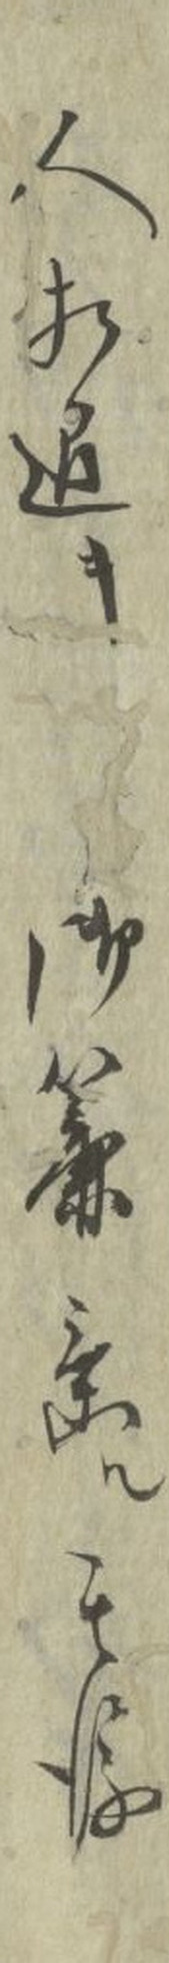人相退き御簾垂る其後
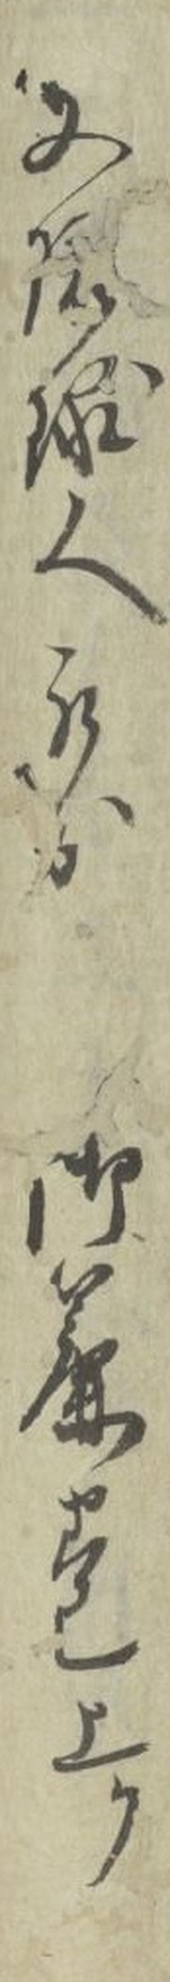又琉球人罷出御簾巻上け
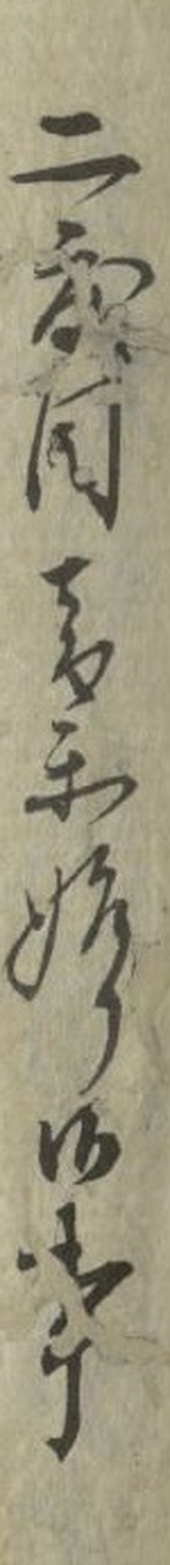二度目音楽始り候事
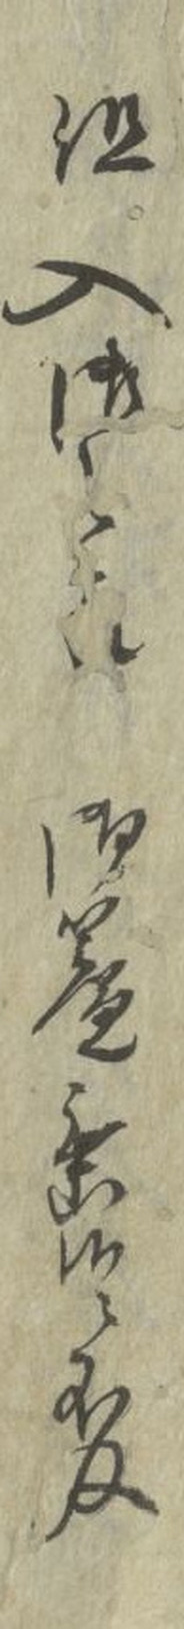但入御之節御簾垂候に不及
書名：琉球来朝記 自八至十四終
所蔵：University of the Ryukyus Library
